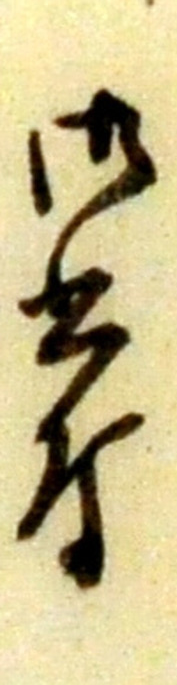御書付
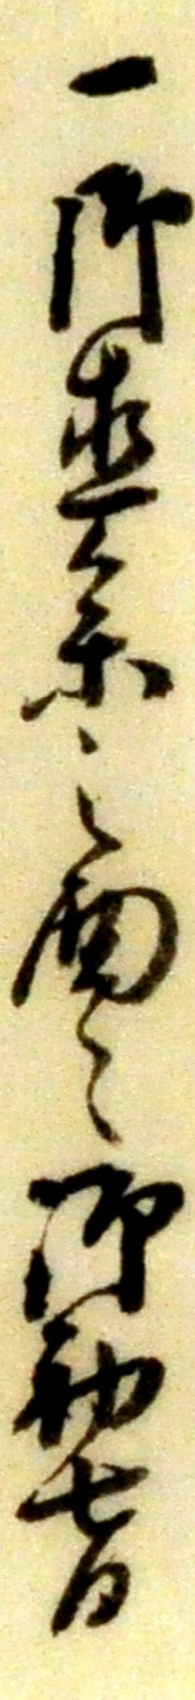一御直参之面々御初七日
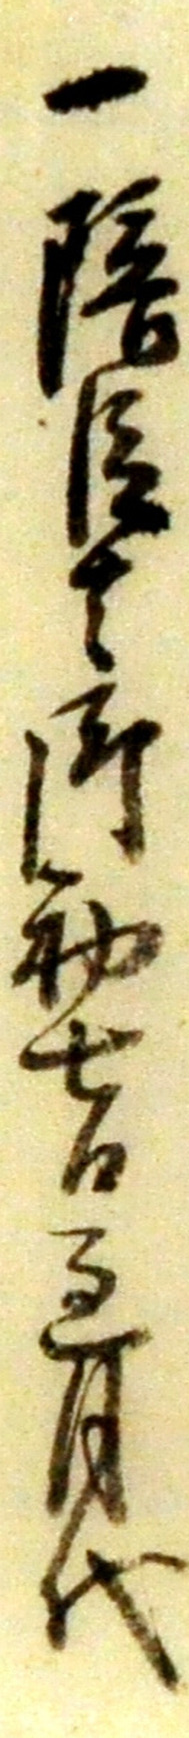一陪臣者御初七日過月代
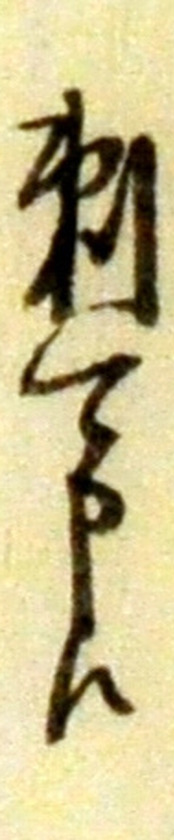刺可申候
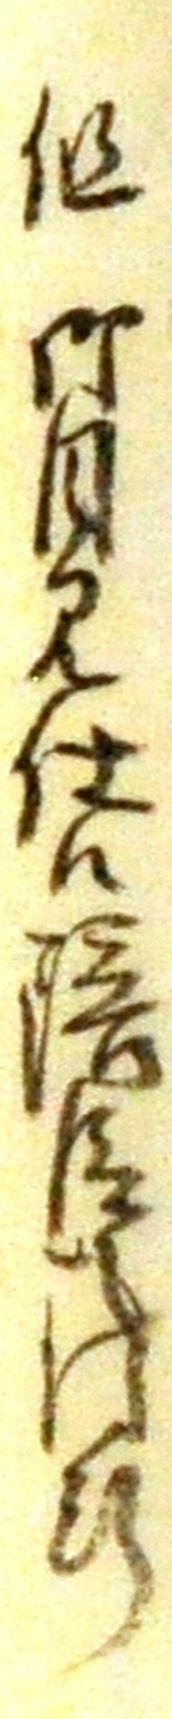但御自見仕候陪臣も同断

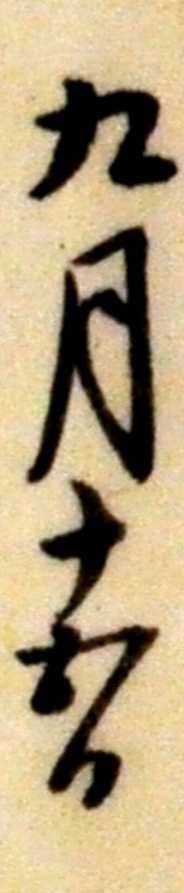九月十五日
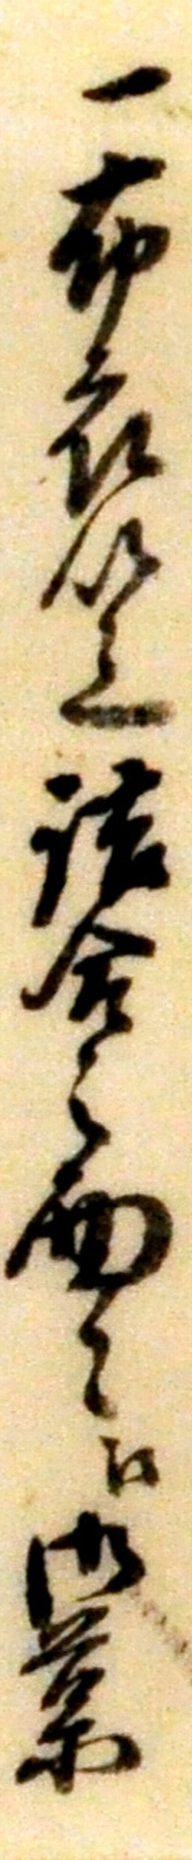一布衣以上詰合之面々江御菓
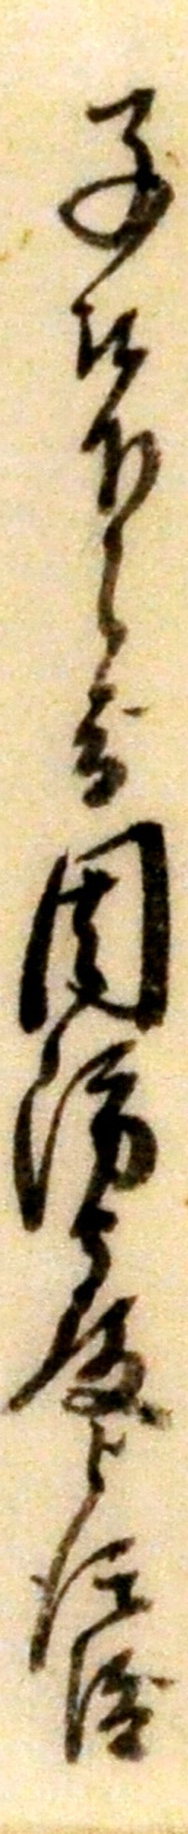子被下之旨周防守殿被仰渡
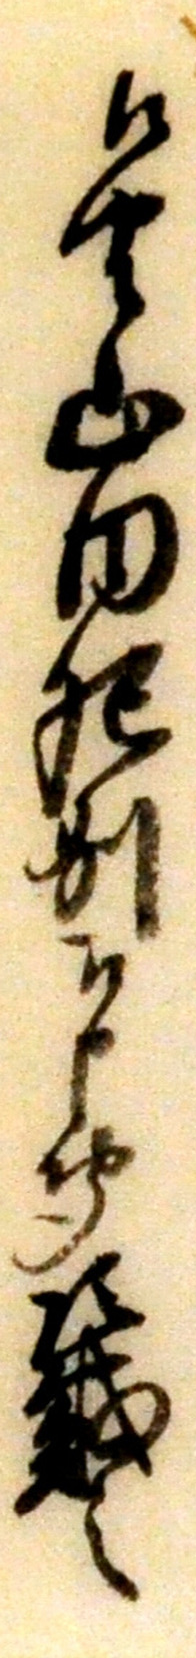候由山田紀州江申聞頂戴之
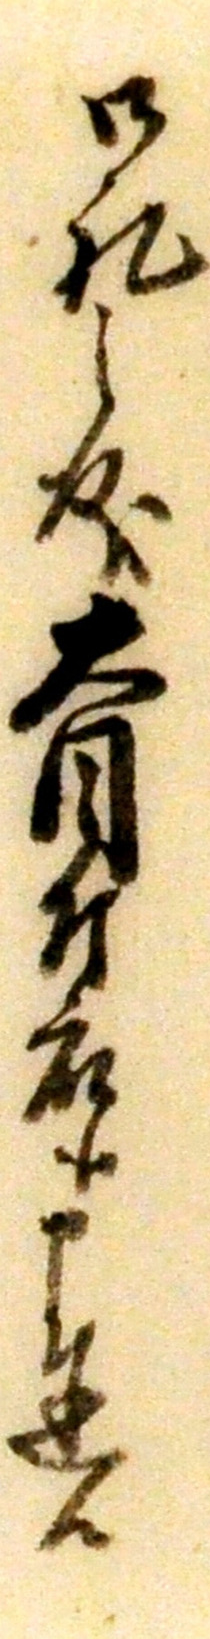御礼之儀大目付衆江申達候
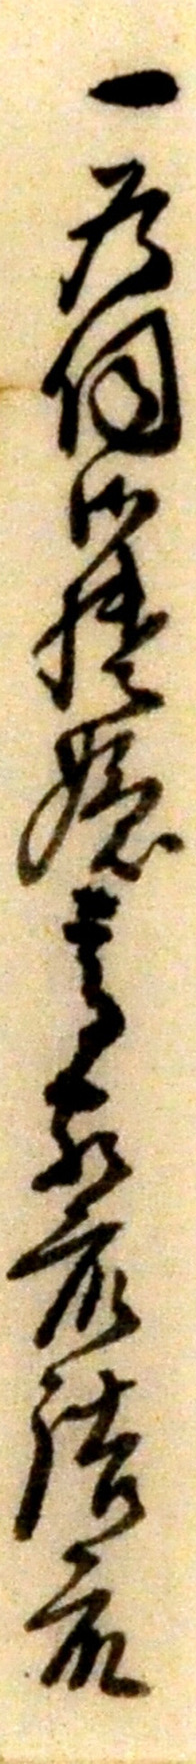一為伺御機嫌高家衆詰衆
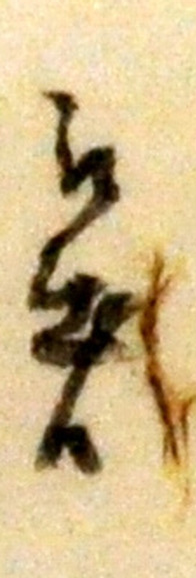被出候
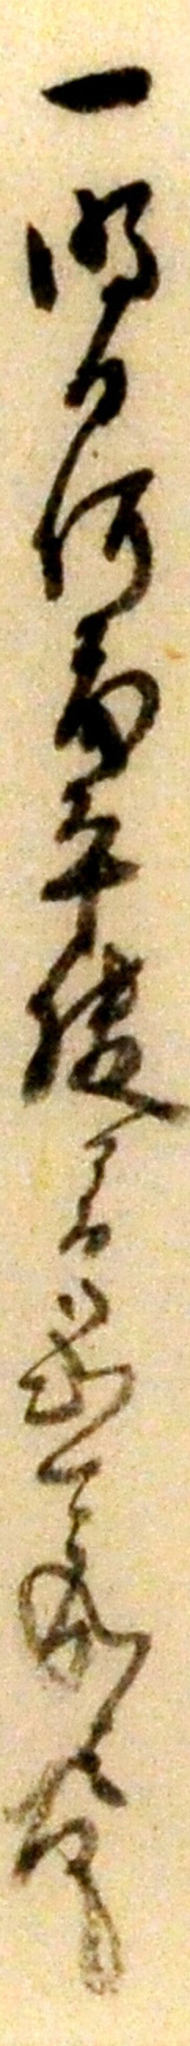一明日何茂平服ニ而御出可成与存候
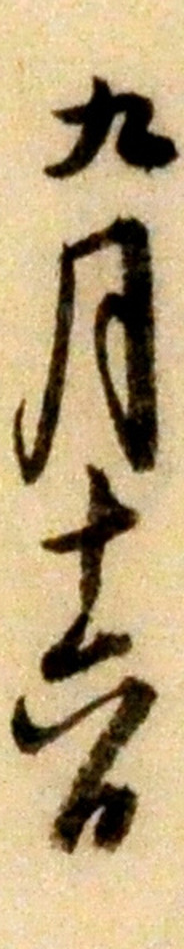九月十六日
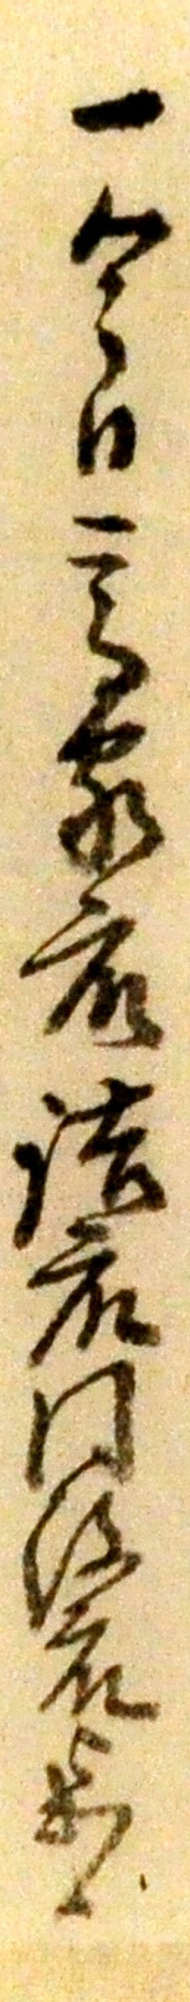一今日高家衆詰衆同役衆被出候
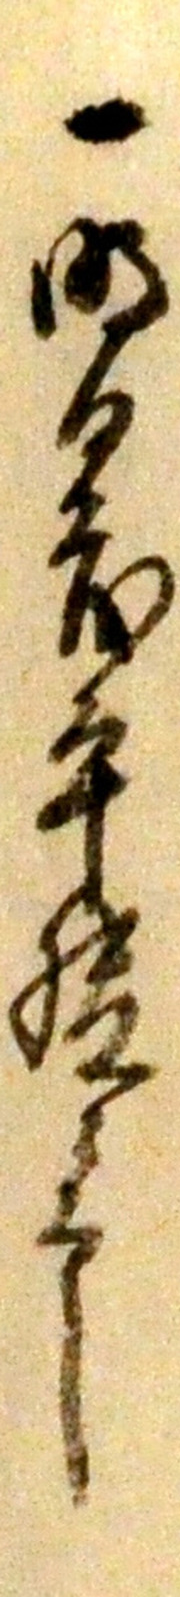一明日茂平服ニ而
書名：書抜
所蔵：伊那市立高遠町図書館・合同会社AMANE
